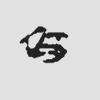首
